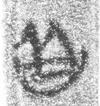皆
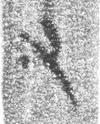又（有）
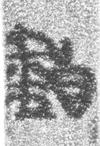鉤
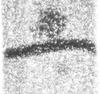一
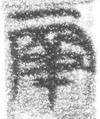兩
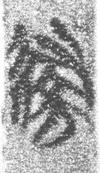○（畫）
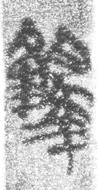{韋睪}
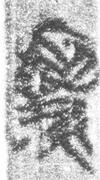○（屨）
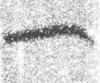一
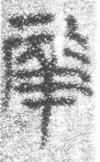兩
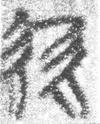絲
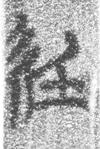○（屐）
